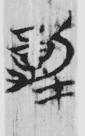勛
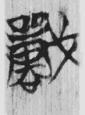戰
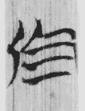於
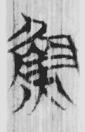魚
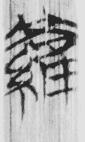羅
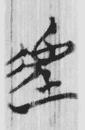𫊟
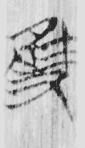雘
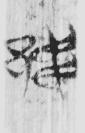{邑𣐺}
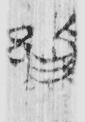{此阝}
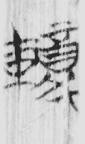輹
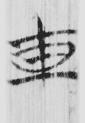車
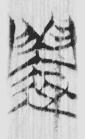{門衣衣}
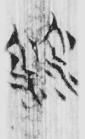{介水介水}
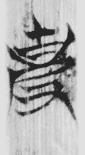尅
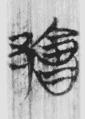鄶
